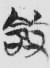○（令）
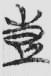壴
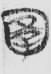圍
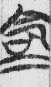命
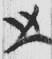之
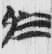於
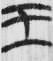王
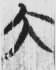大
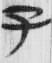子
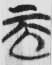而
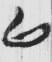㠯（以）
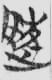{阩止}
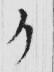人
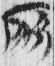所
